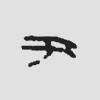于
